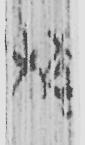柭
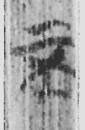不
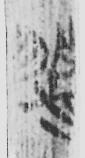閟
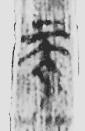而
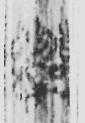{糸興}
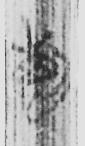{叀刀}
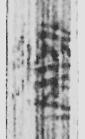{辶止㚔}（失）
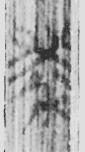楑
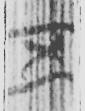五
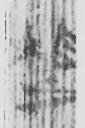{相止}
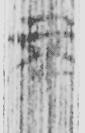不
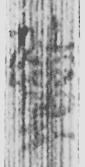疆
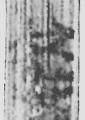罔
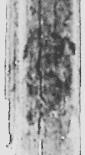{冖肉}
